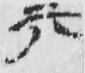亓
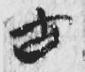古
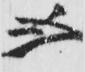之
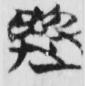○（舉）
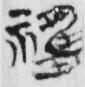禱
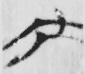太
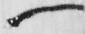一
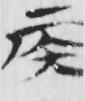矦（后）
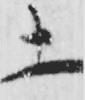土
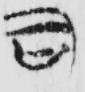司
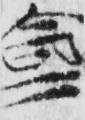命
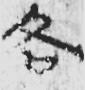各
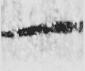一
